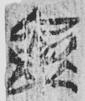○（寧）
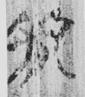○（移）
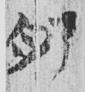肥
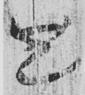也
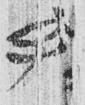孔子
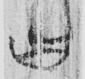曰
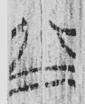丘
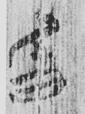昏（聞）
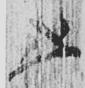之
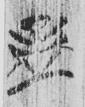孟
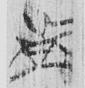者（子）
